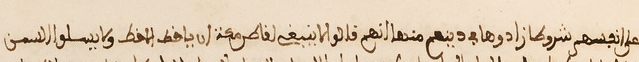على انفسهم شروطا زادوها في دينهم منها انهم قالوا لا ينبغى لقاطن مكة ان ياخط الاخط ولا يسلوا السمن
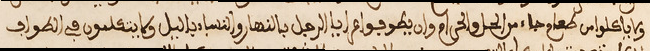ولا ياكلوا من طعام جاء من الحل والحر ام وان يطوفوا عرايا الرجل بالنهار والنساء باليل ولا يتكلمون في الطواف
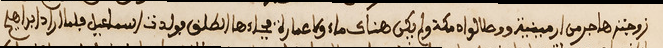زوجته هاجر من ارمينية ووصلالواه مكة ولم يكن هناك ماء ولا عمارة فجاءها الطلق فولدت اسماعيل فلما اراد ابراهيم
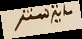ماية سنة
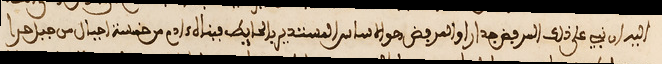اليه ان بني على ذلك المرفض جدارا والمرفض هو الاساس المستدير بالحايط فبناه ءادم من خمسة اجبال من جبل حدا
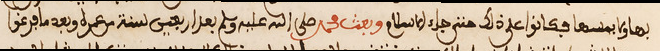بها ولا يمسها فكانوا على ذلك حتى جاء الاسلام وبعث محمد صلى الله عليه وسلم بعد اربعين سنة من عمره وبعد ما فرغوا
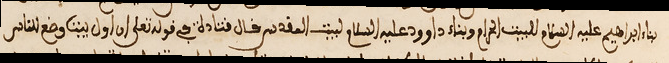بناء ابراهيم عليه السلام للبيت الحرام وبناء داوود عليه السلام لبيت المقدس قال قتادة في قوله تعلى ان اول بيت وضع للناس
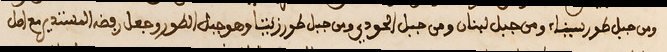ومن جبل طور سيناء ومن جبل لبنان ومن جبل الحودي ومن جبل طور زيتا وهو جبل الطور وجعل رفضه المستدير مع اصل
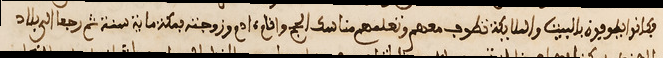فكانوا يطوفون بالبيت والملايكة تطوف معهم وتعلمهم مناسك الحج وانام ءادم وزوجته بمكة ماية سنة ثم رجعا الى بلاد
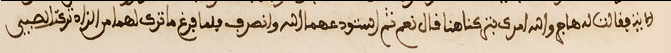الاية فقالت له هاجر والله امرك بتركناهنا قال نعم ثم استودعهما الله وانصرف فلما فرغ ما ترك لهما من الزاد تركت الصبي
